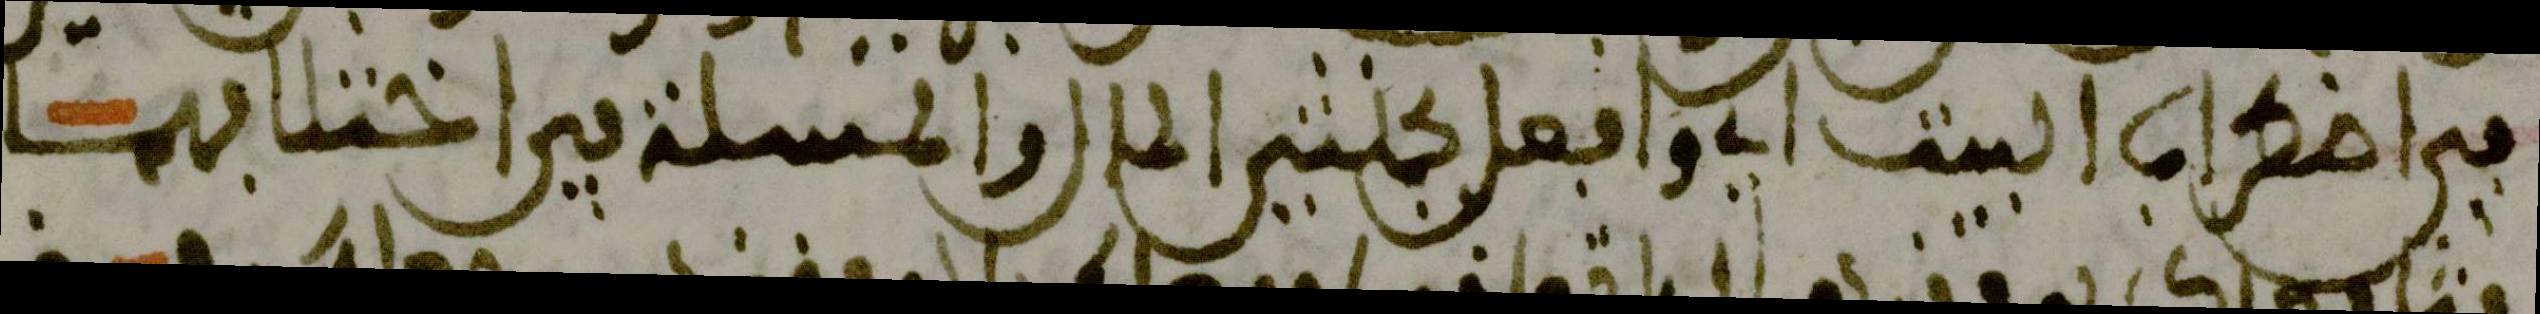في اضطراب البيت اي وافعل بجملتي المال والمسلة في اختلافهَا
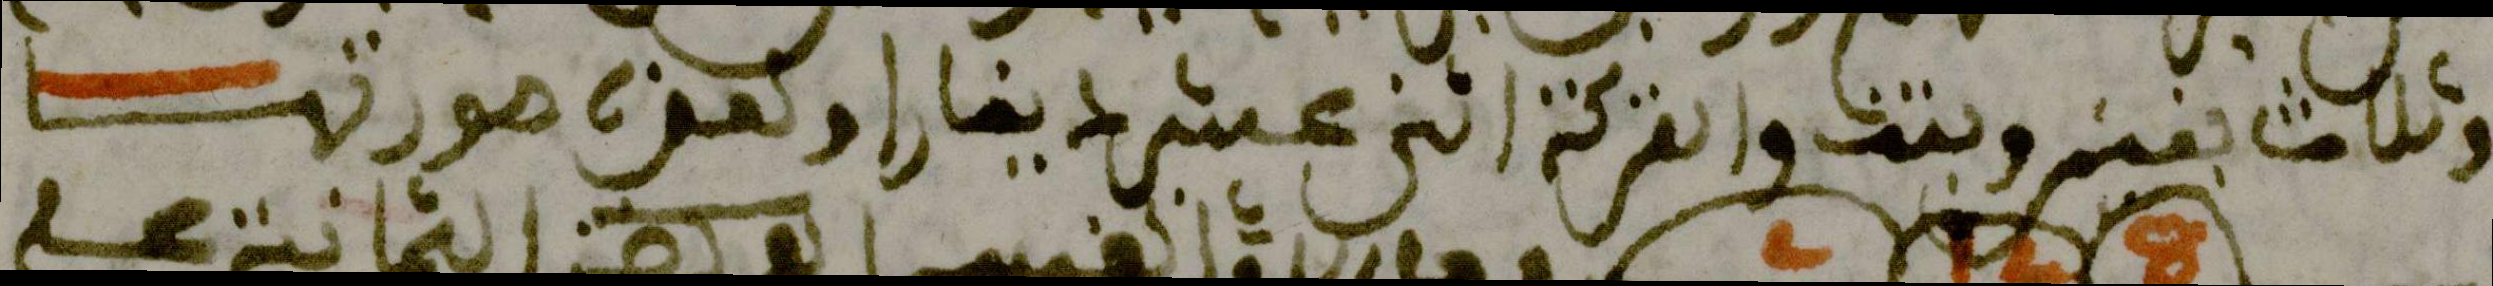وثلاث بنين وبنت والتركة اثنى عشر دينار وهذه صورتهَا
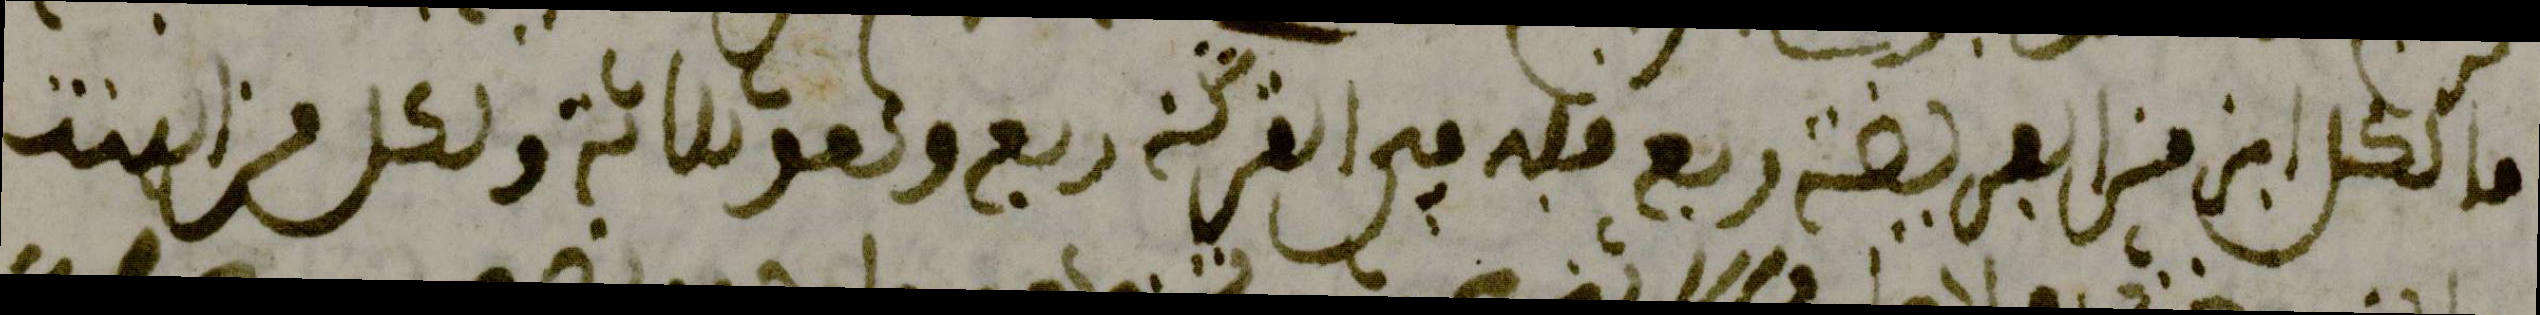ما لكل ابن من الفريضة ربع فله في التركة ربع وهو ثلاثة ولكل من البنت
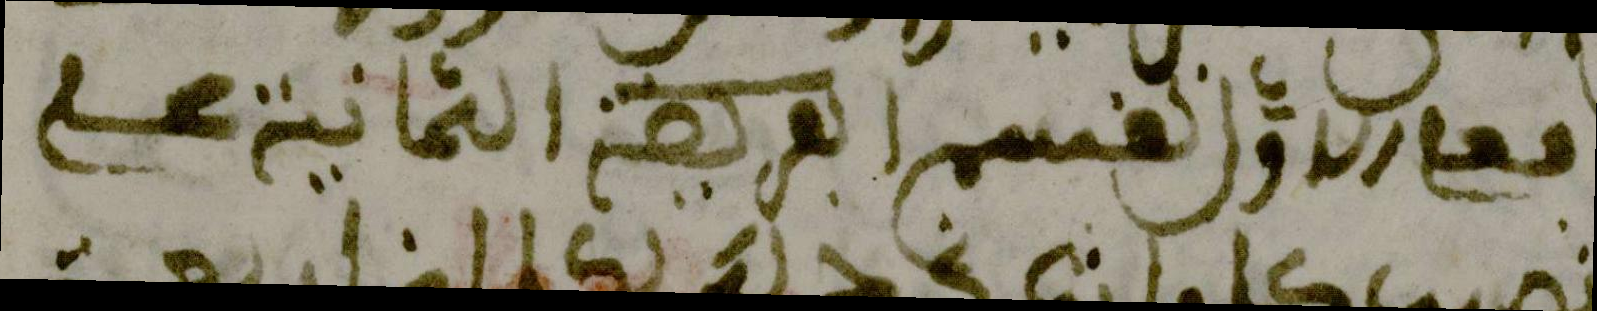فعلى الاوّل تقسم الفريضة الثمانية على
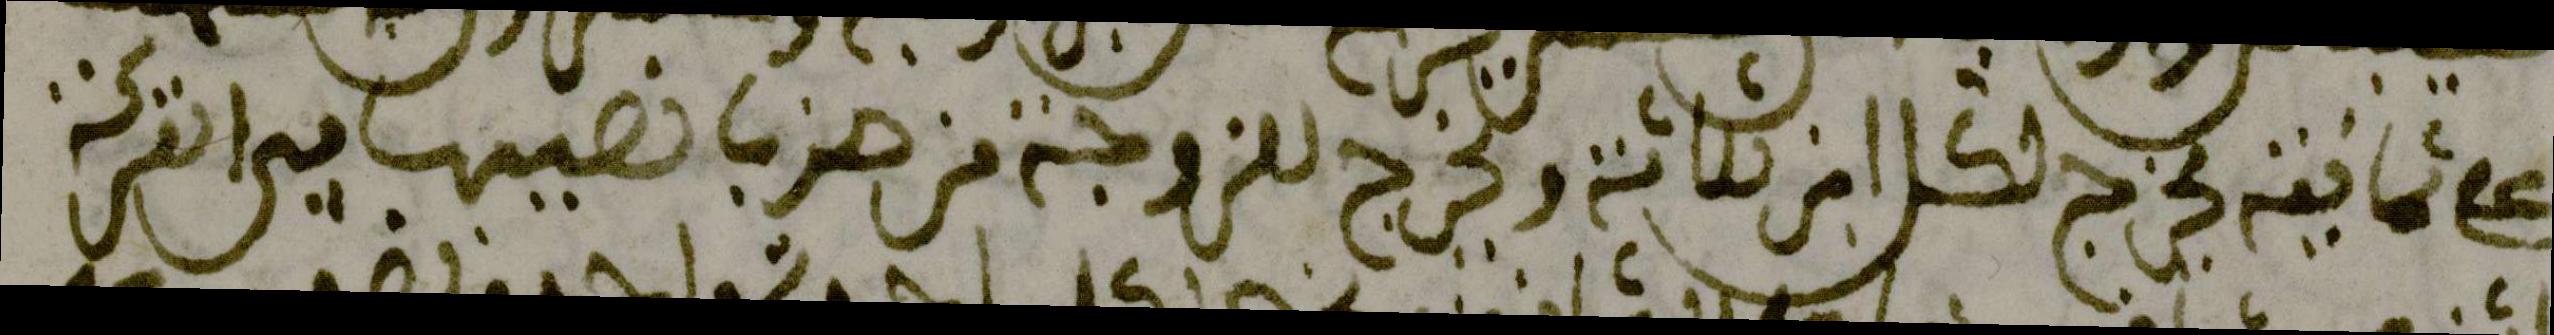على ثمانية يخرج لكل ابن ثلاثة ويخرج للزوجة من ضرب نصيبها في التركة
